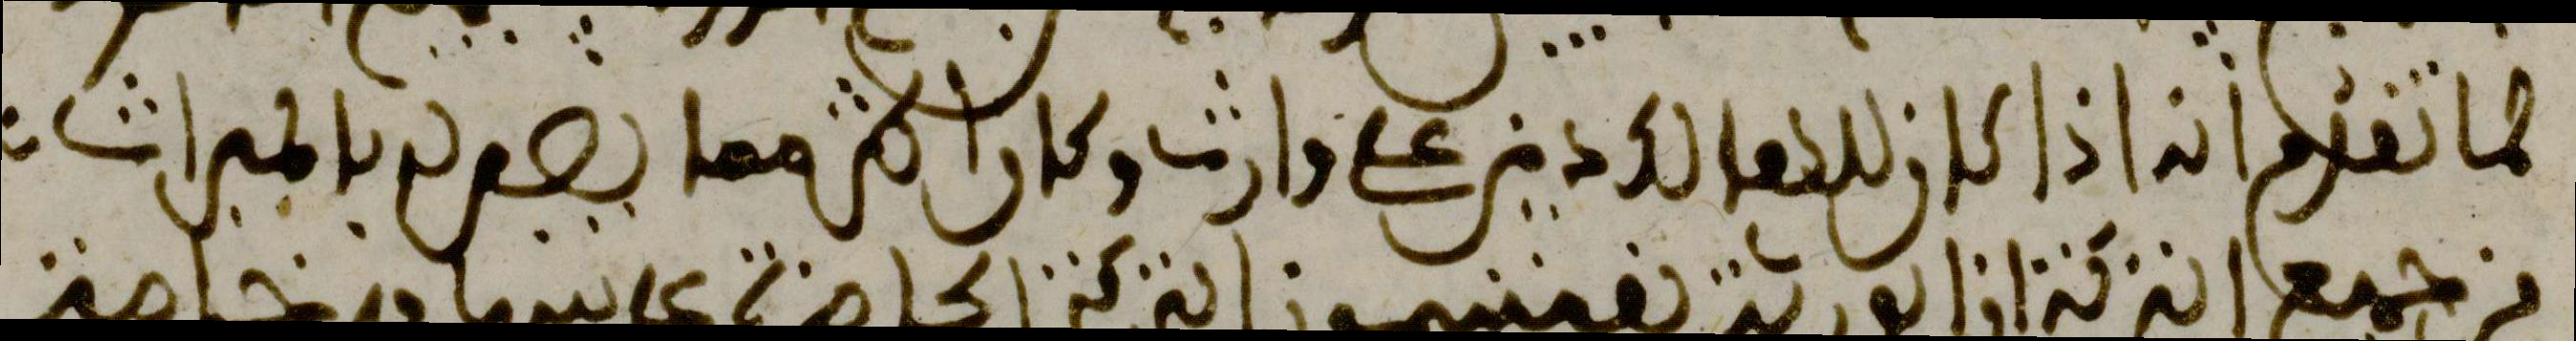لما تقدم انه اذا كان الهالك دين علي وارث وكان اكثر مما يصير له بالميراث
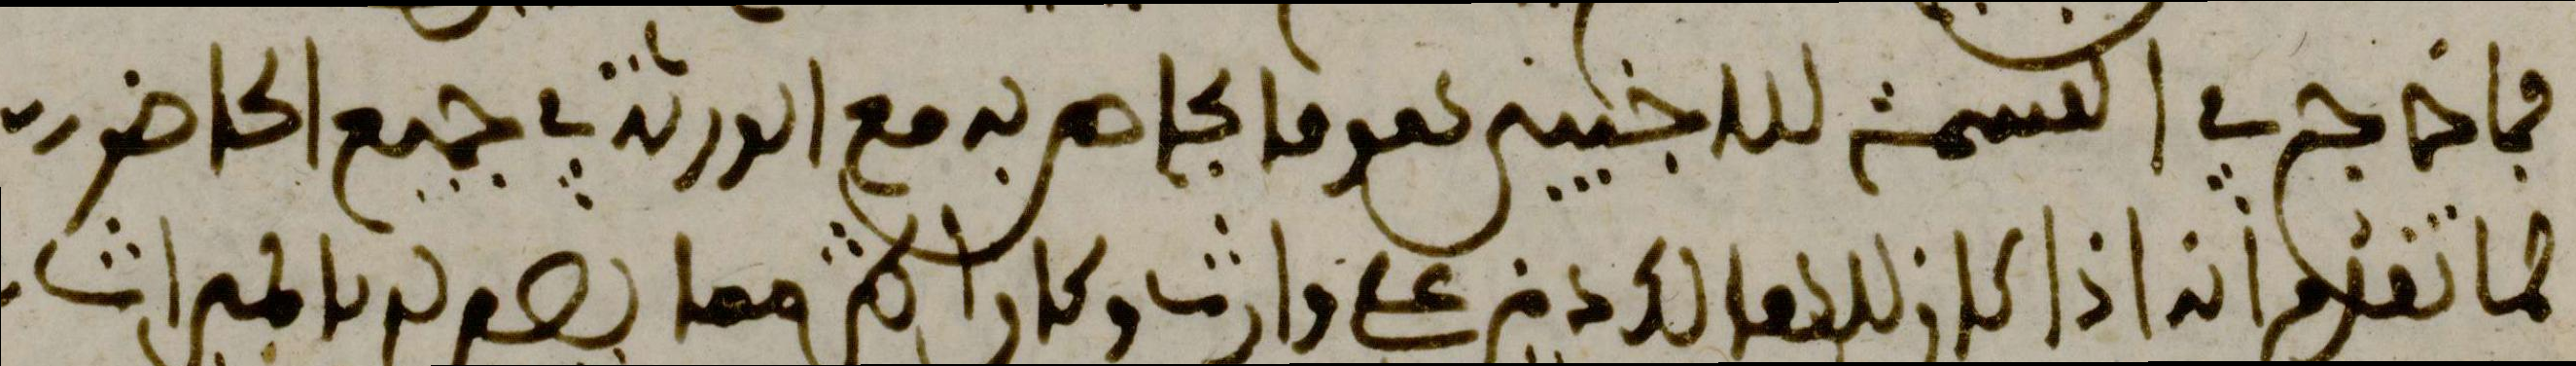فما خرج في القسمة للاجنبي هو ما يحاص به مع الورثة في جميع الحاضر
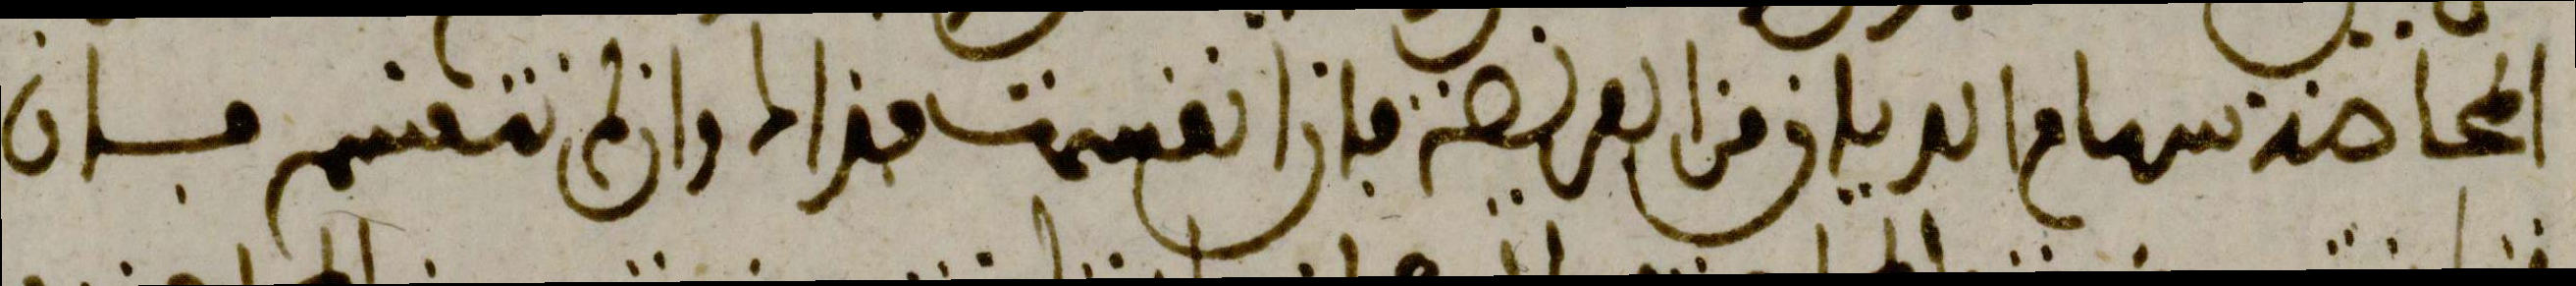المحاصة سهام الديان من الفريضة فان انقسمت فذلك وان لم تنقسم فان
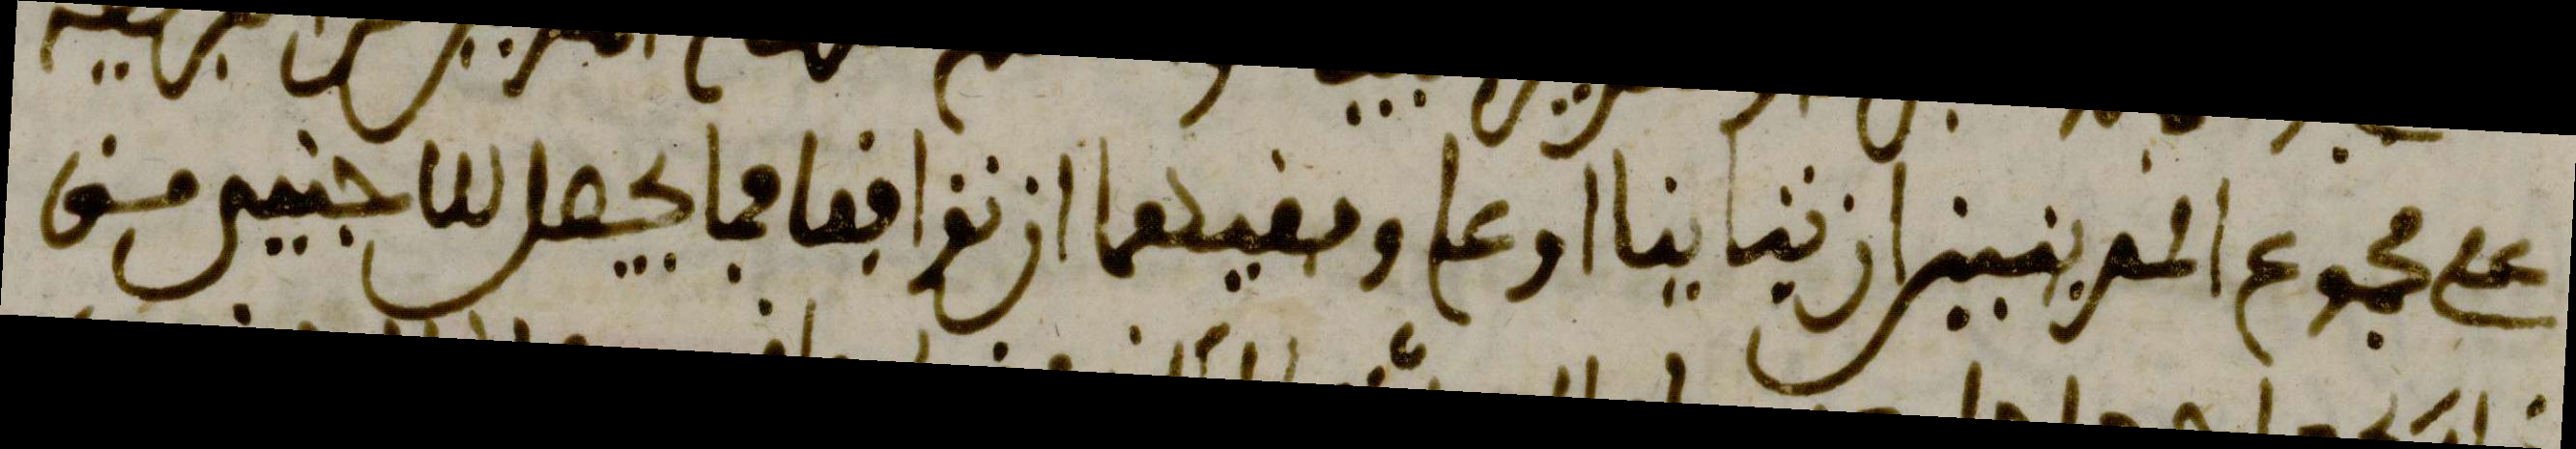على مجموع المدينين ان تباينا او على وفقيهما ان توافقا فما يحصل للاجنبي من
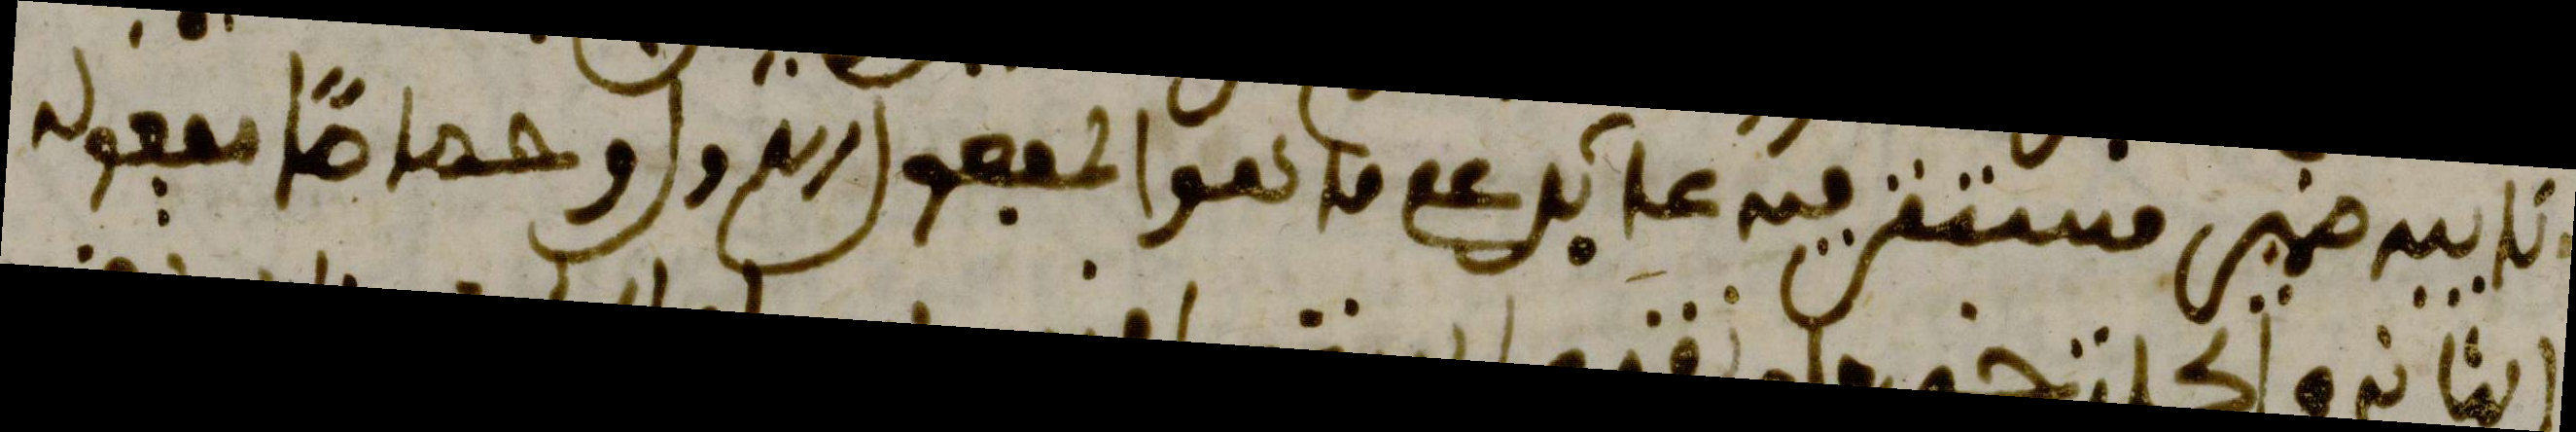نائبه ضمير مستتر فيه عائد على ما هو المفعول الاول وحصاصًا مفعول
